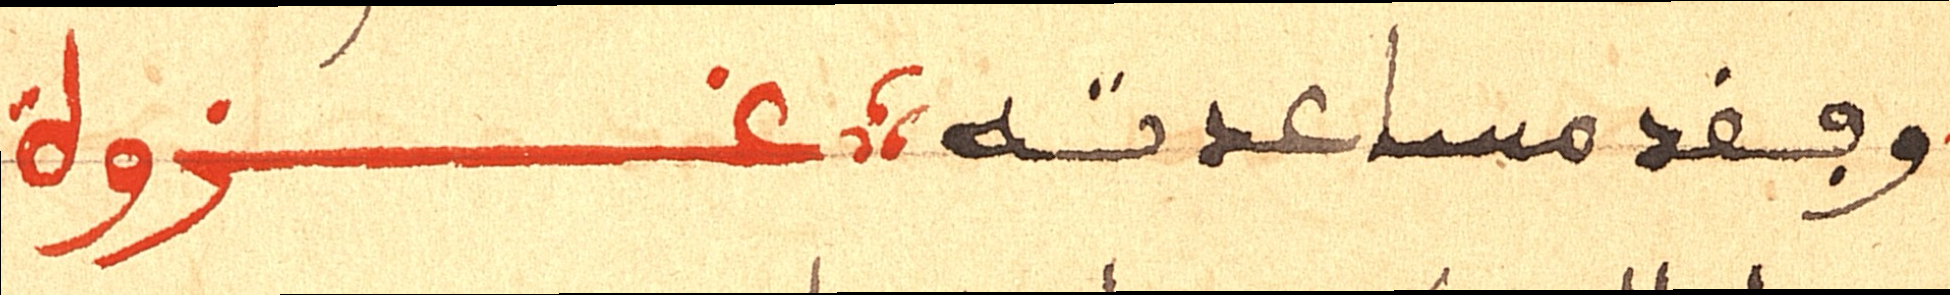وفقد مساعدته غزوة
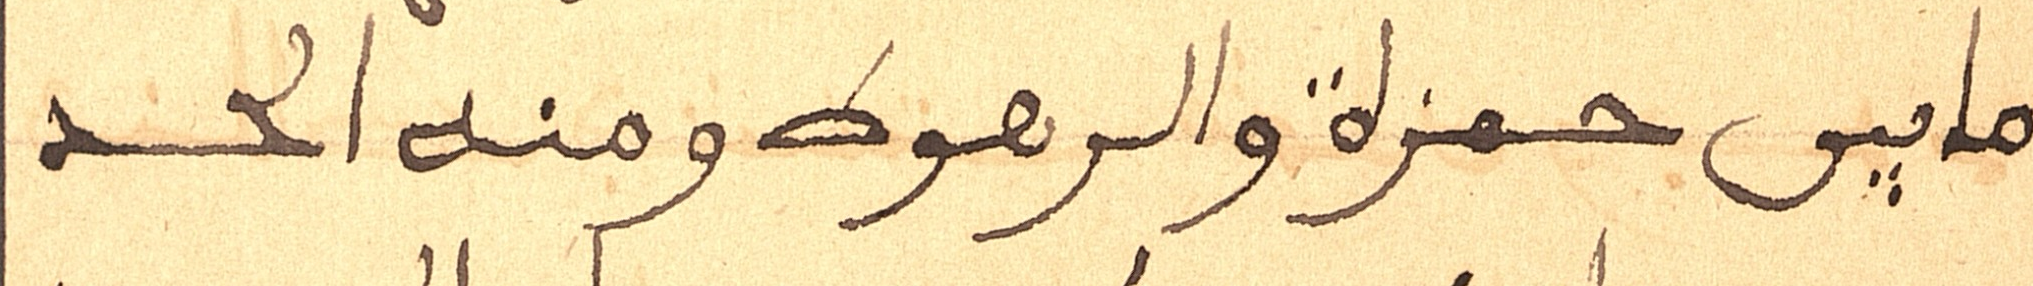مابين حمزة والرهوط ومنه الحد
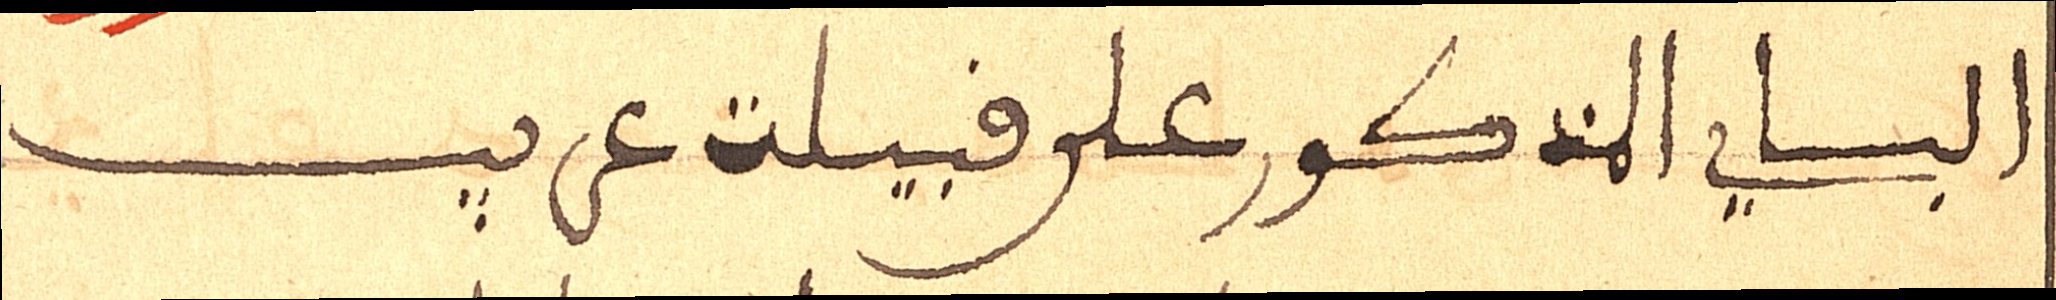الباي المذكور على قبيلة عريب
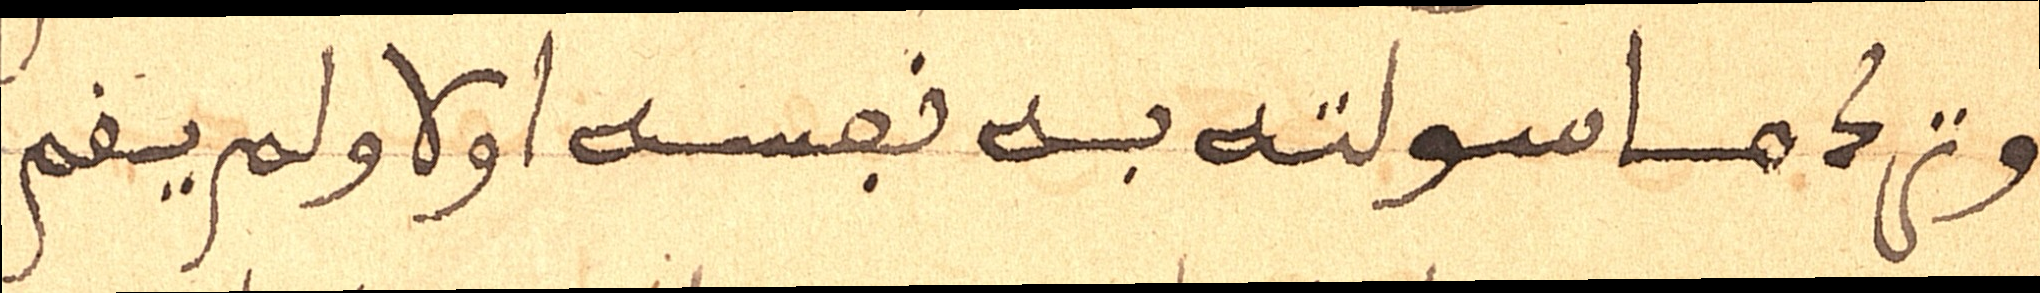وترك ماسولته به نفسه اولا ولم يقم
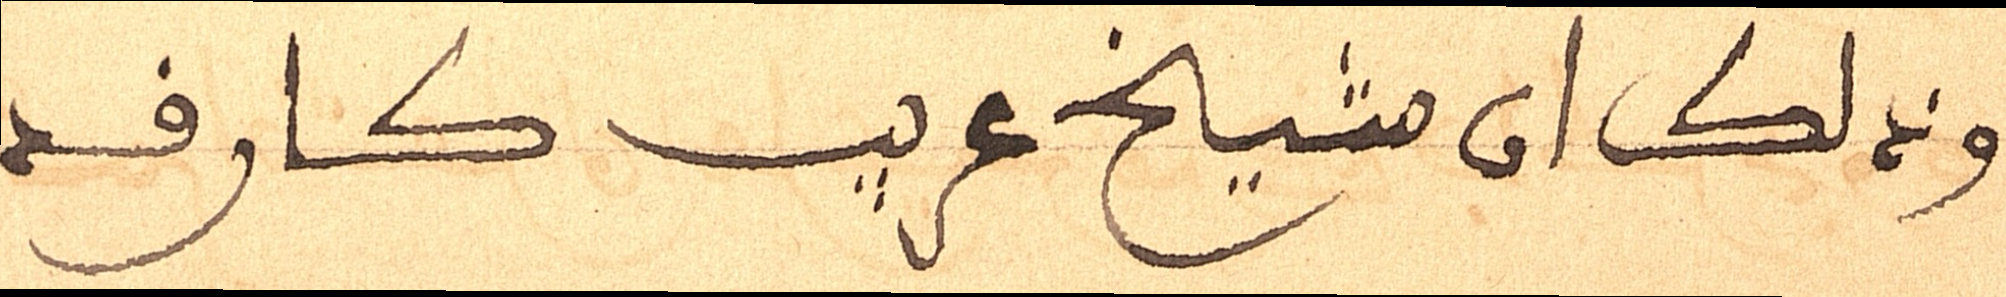وذلك ان شيخ عريب كان قد
